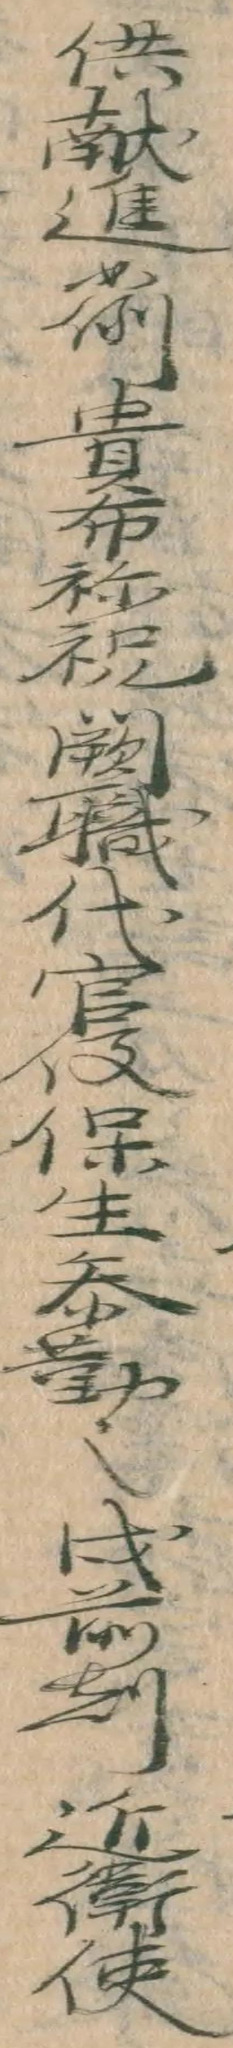供献進如例貴布祢祝闕職代官使保生奉勤也戌前刻近衛使
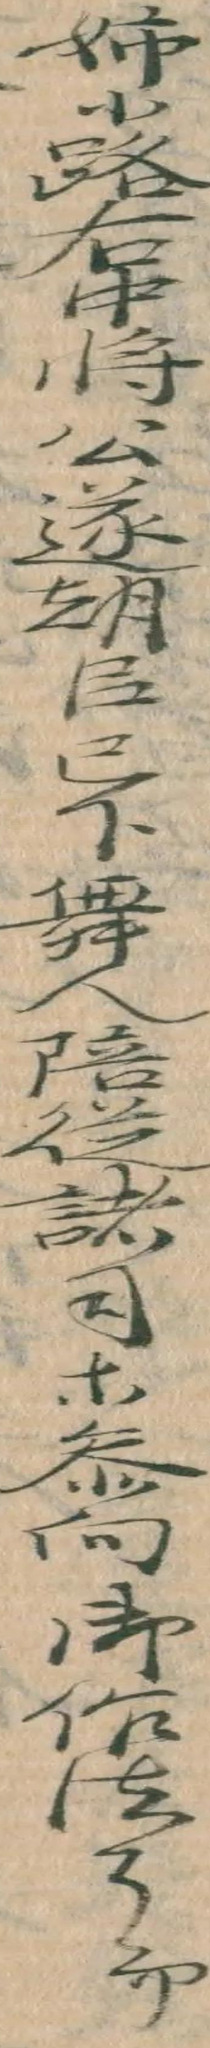姉小路右中将公遂朝臣已下舞人陪従諸司等参向御作法了而
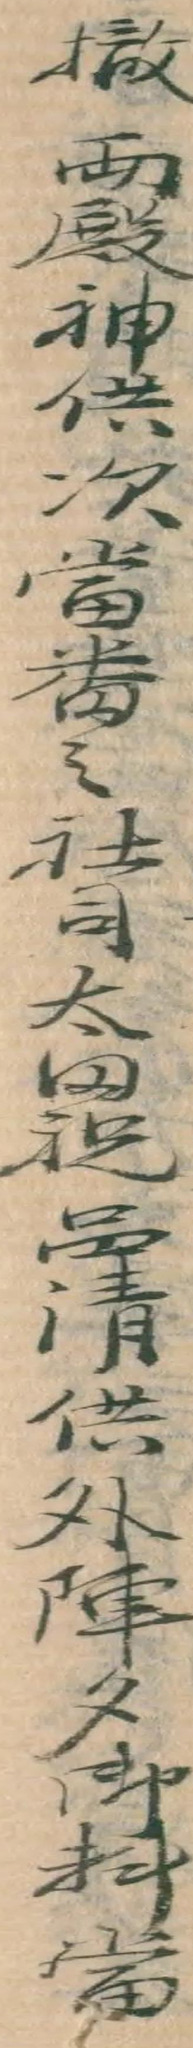撒両殿神供次當番之社司太田祝品清供外陣夕御料當
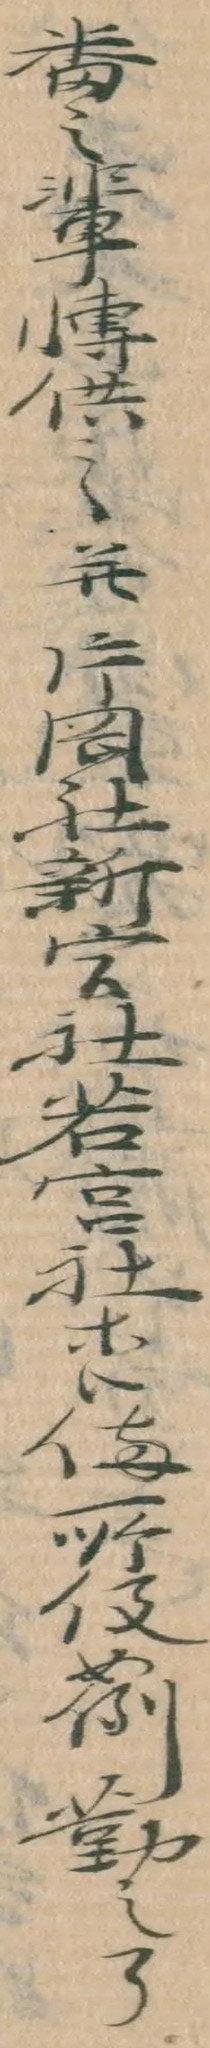番之輩轉供也并片岡社新宮社若宮社等御備所役如例勤之了
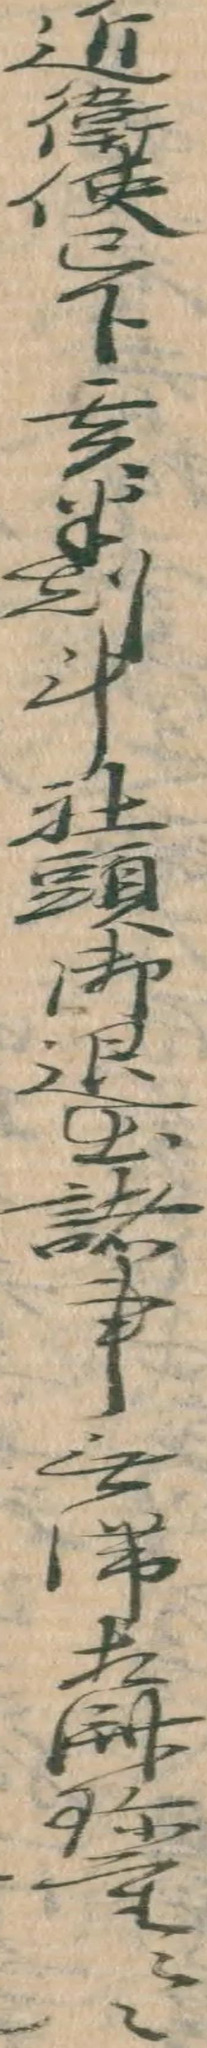近衛使已下亥半刻斗社頭御退出諸事無滞相済珍重々々
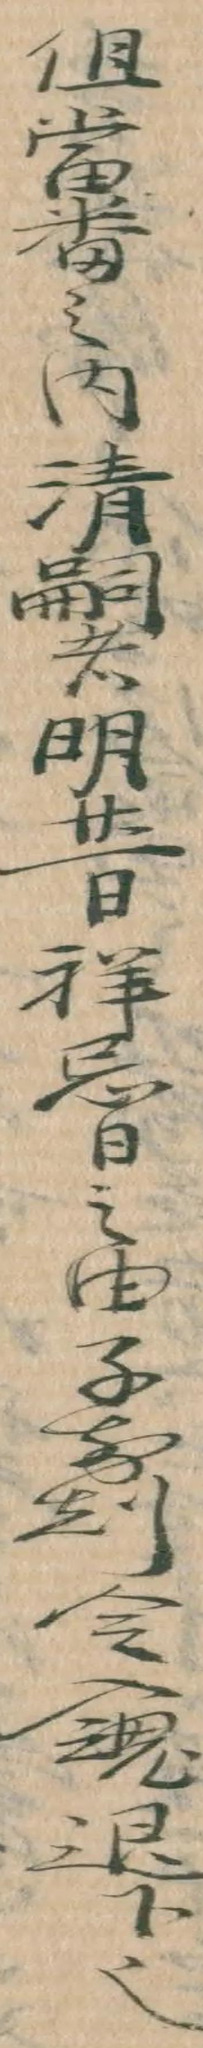但當番之内清嗣者明廿一日祥忌日之由子前刻令入魂退下也
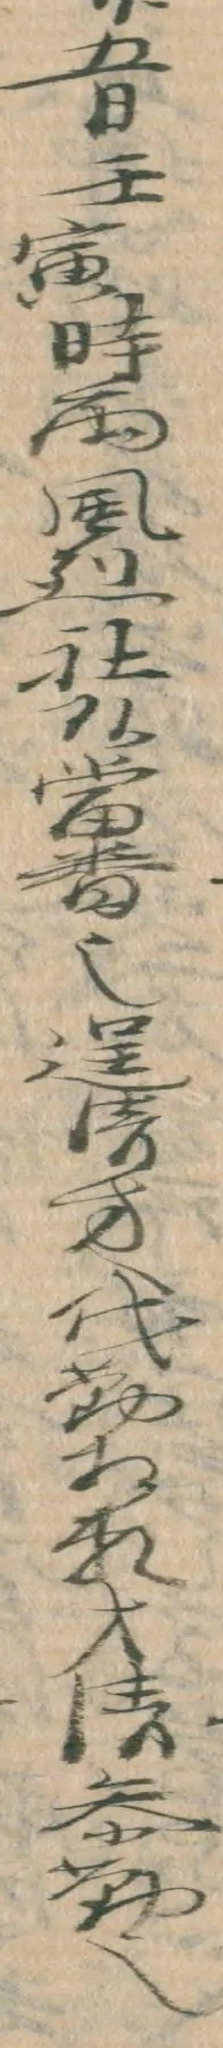廿五日壬寅時雨風烈社頭當番也逞清方代勤相頼才清参勤之
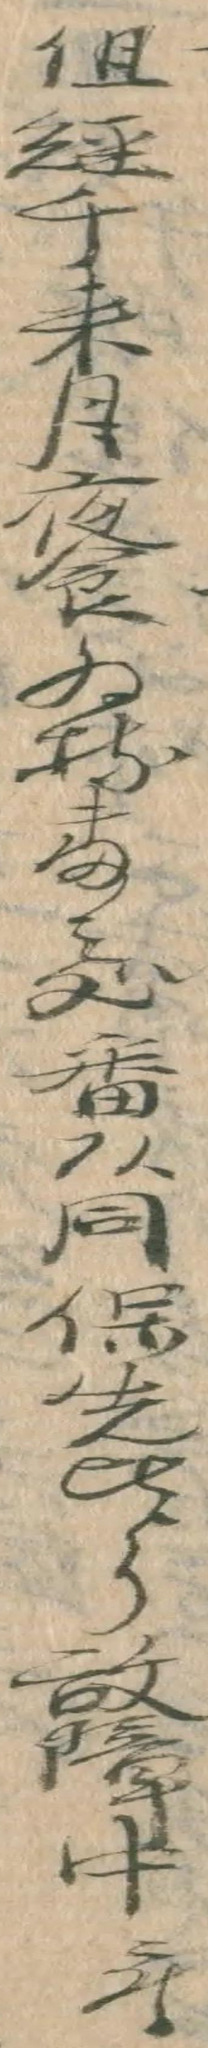但経千来月夜食為持番之処番頭同保先頃より故障中ニ付
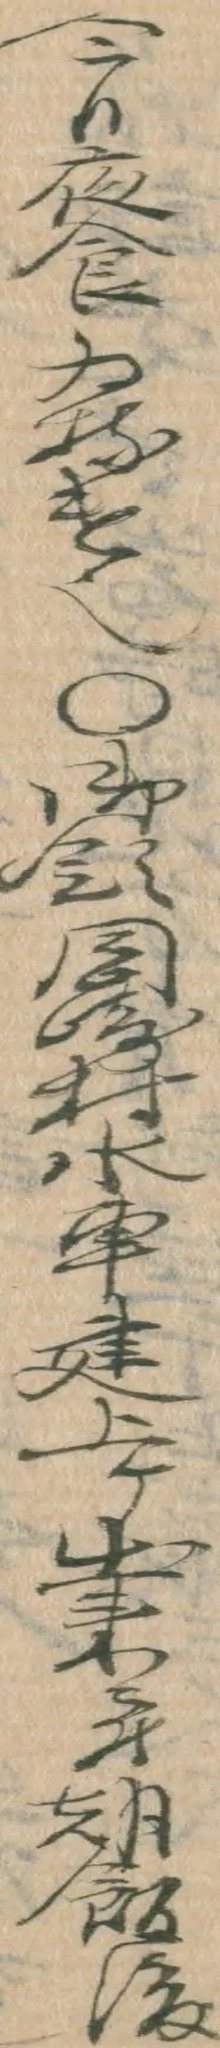今日夜食為持遣也○御領岡崎村水車建上ケ出来ニ付朝飯後
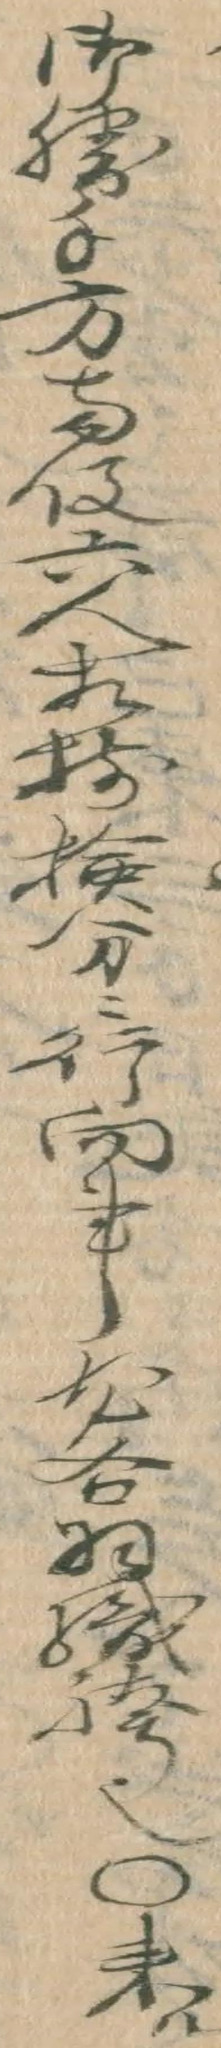御勝手方両役六人相揃検分ニ行向事尤各羽織袴也〇来ル
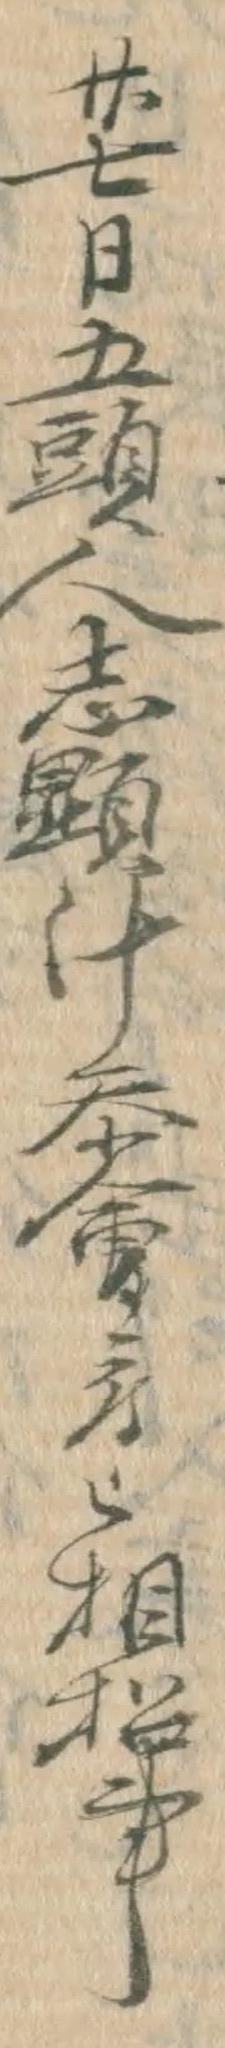廿七日五頭人志顕汁参會ニ付被相招事
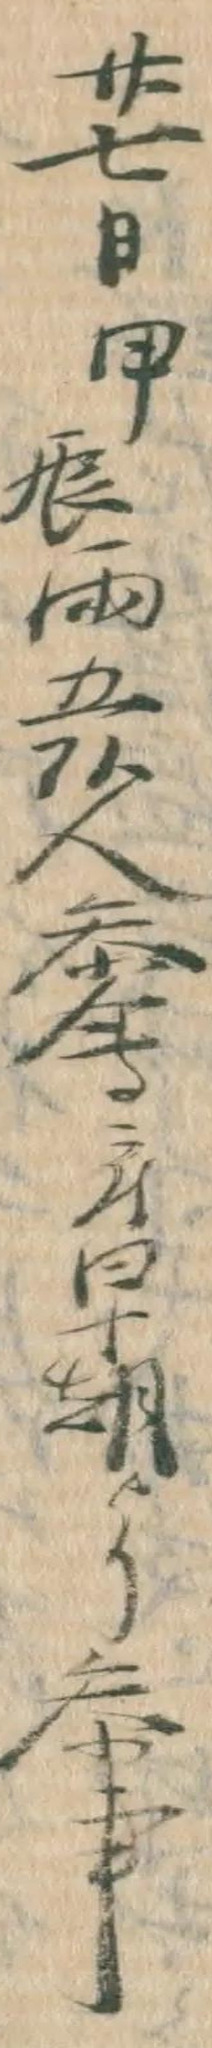廿七日甲辰雨五頭人参會ニ付日早朝より参事
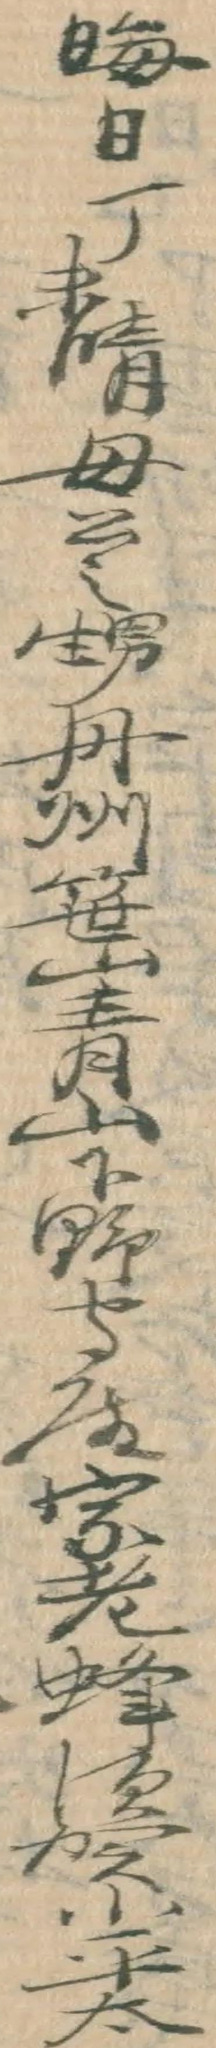晦日丁未請母公之甥丹州笹山青山下野守殿家老蜂須賀小平太
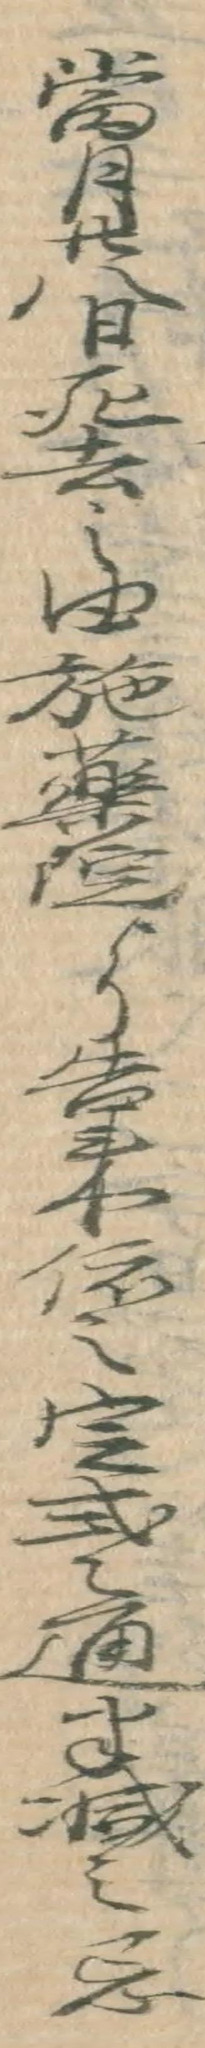當月廿八日死去之由施薬院より告来依之定式之通半減之忌
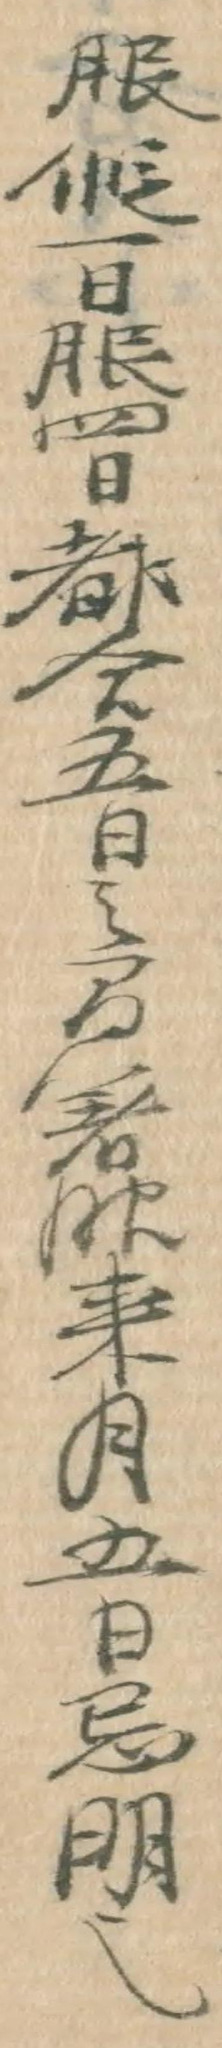服暇一日服四日都合五日之間着服来月五日忌明也

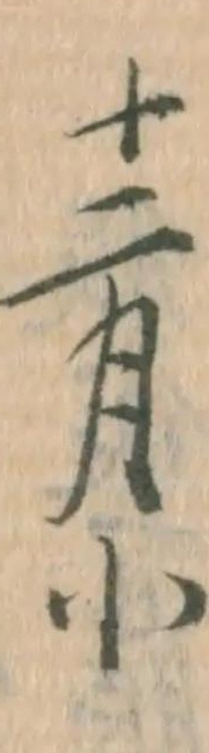十二月小
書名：賀茂社記録. 第65冊
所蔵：国立国会図書館 National Diet Library, JAPAN
